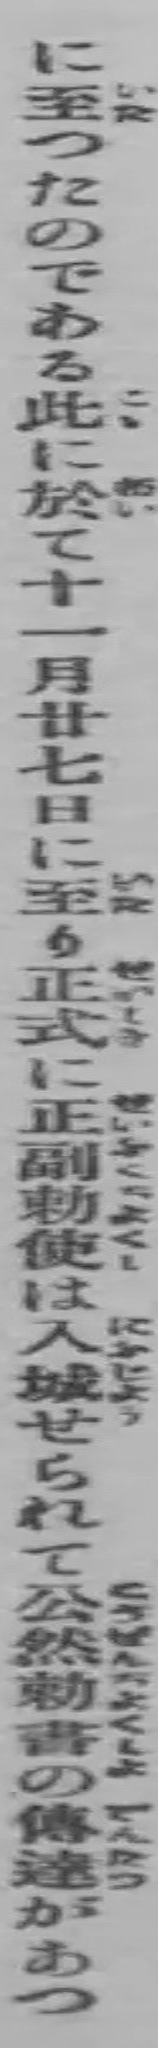に至つたのである此に於て十一月廿七日に至り正式に正副勅使は入城せられて公然勅書の伝達があつ
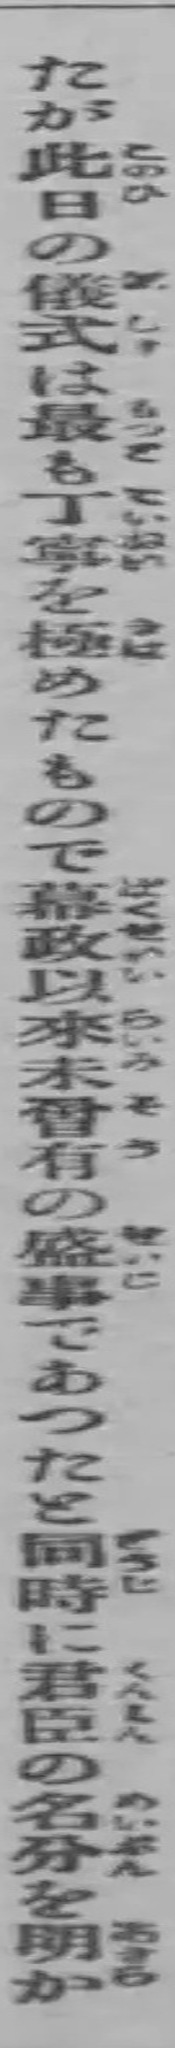たが此日の儀式は最も丁寧を極めたもので幕政以来未曾有の盛事であつたと同時に君臣の名分を明か
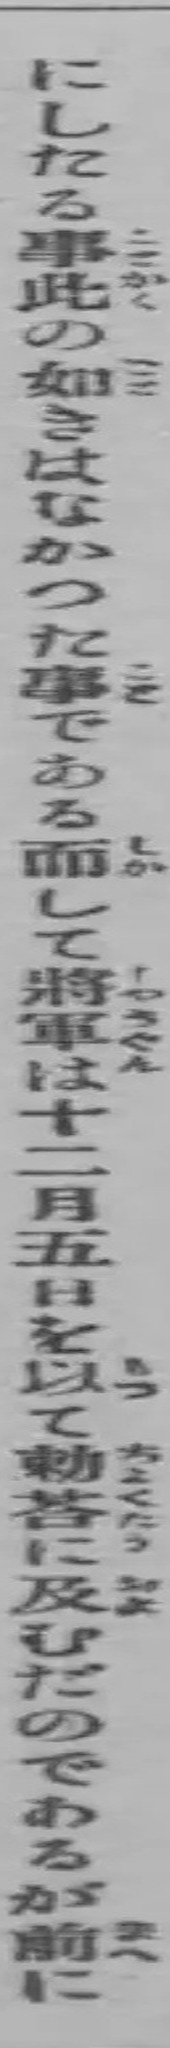にしたる事此の如きはなかつた事である而して将軍は十二月五日を以て勅荅に及むだのであるが前に
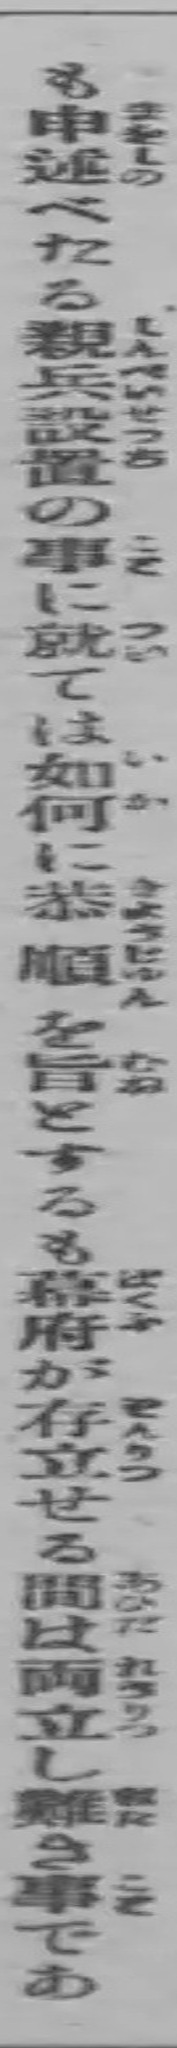も申述べたる新兵設置の事に就ては如何に恭順を旨とするも幕府が存立せる間は両立し難き事であ
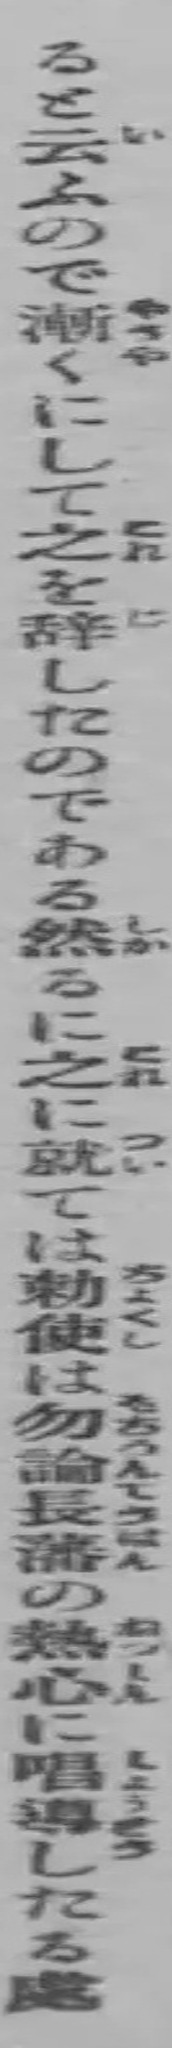ると云ふので漸くにして之を辞したのである然るに之に就ては勅使は勿論長藩の熱心に唱導したる処
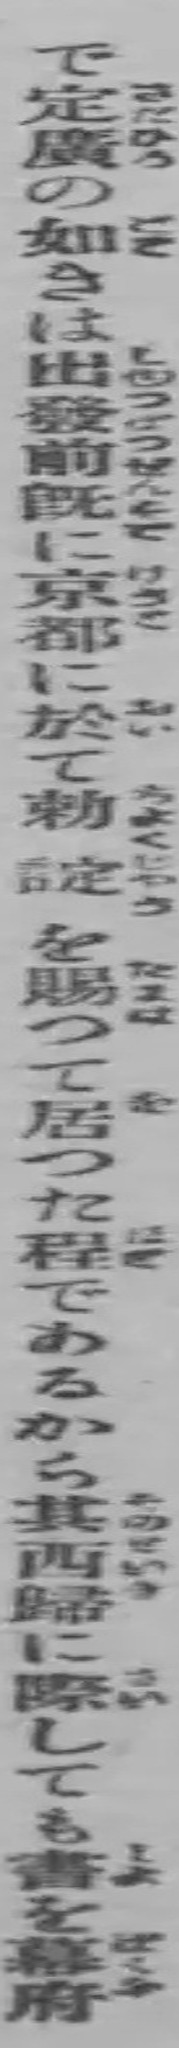で定廣の如きは出発前既に京都に於て勅諚を賜つて居つた程であるから其西帰に際しても書を幕府
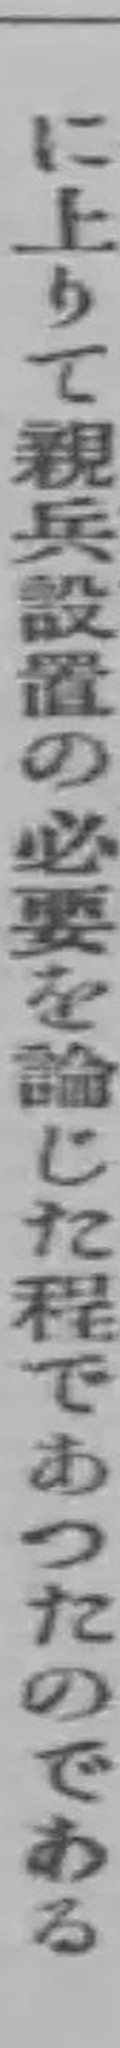に上りて新兵設置の必要を論じた程であつたのである
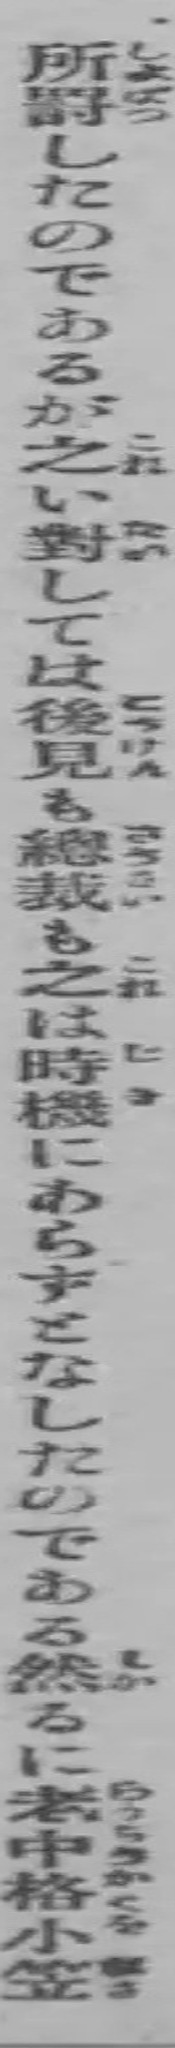所罸したのであるが之に対しては後見も総裁も之は時機にあらずとなしたのである然るに老中格小笠
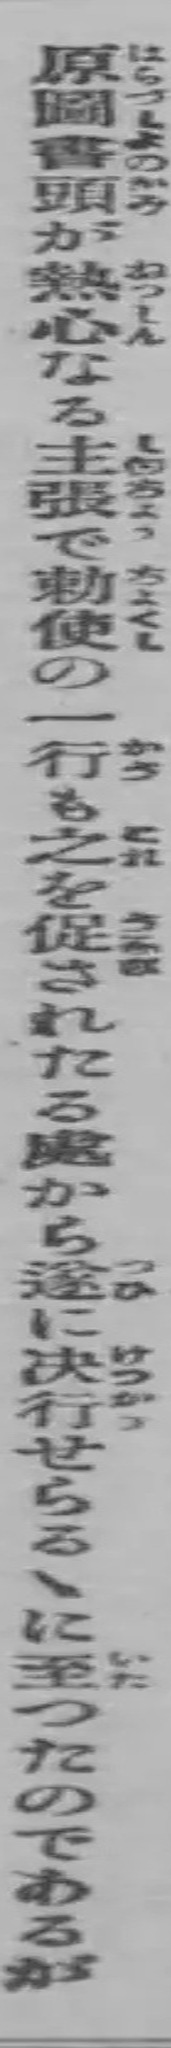原図書頭が熱心なる主張で勅使の一行も之を促されたる処から遂に決行せらるゝに至つたのであるが
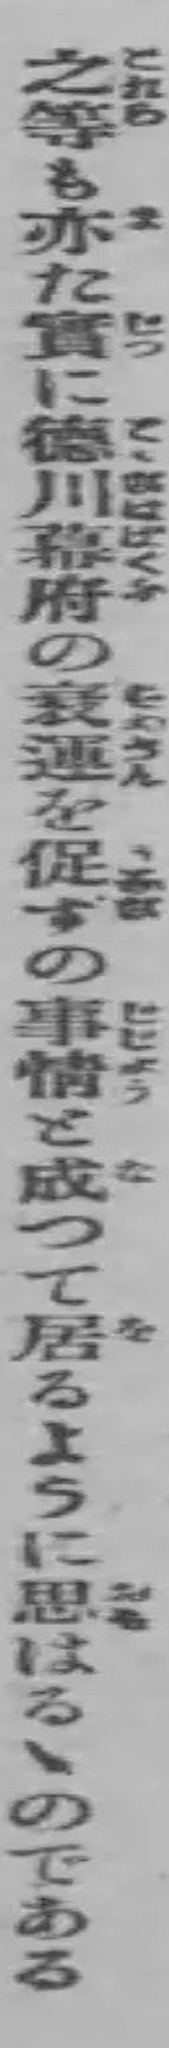之等も亦た実に徳川幕府の衰運を促す事情と成つて居るように思はるゝのである
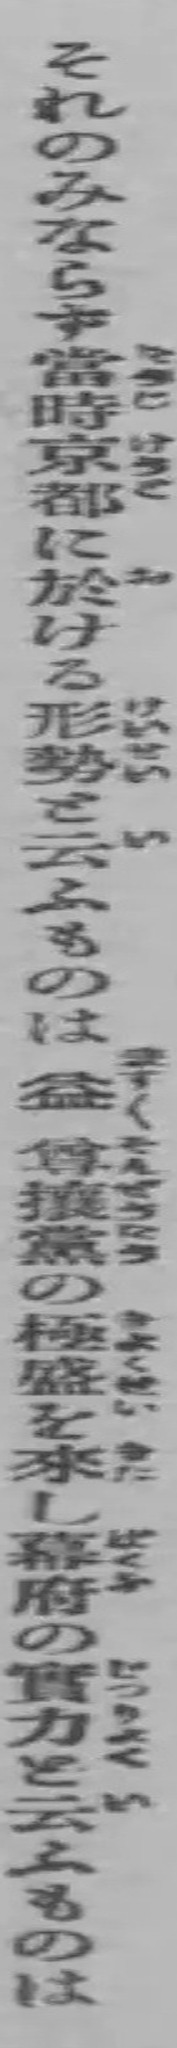それのみならず当時京都に於ける形勢と云ふものは益尊攘党の極盛を来し幕府の実力と云ふものは
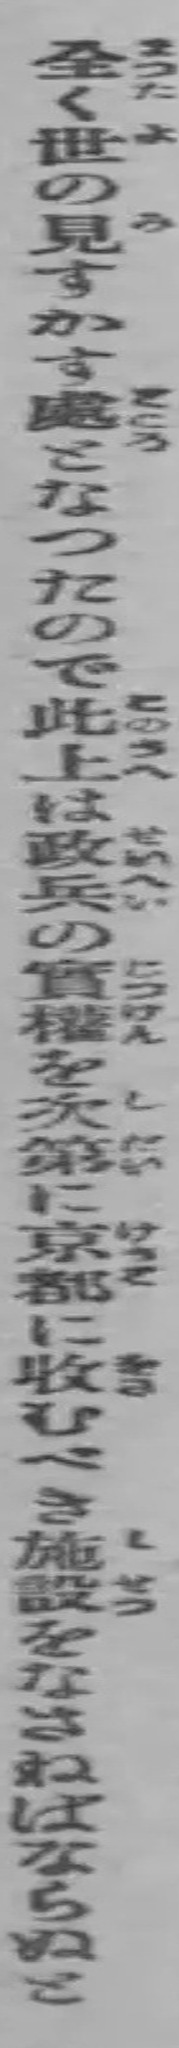全く世の見すかす処となつたので此上は政兵の実権を次第に京都に収むべき施設をなさねばならぬと

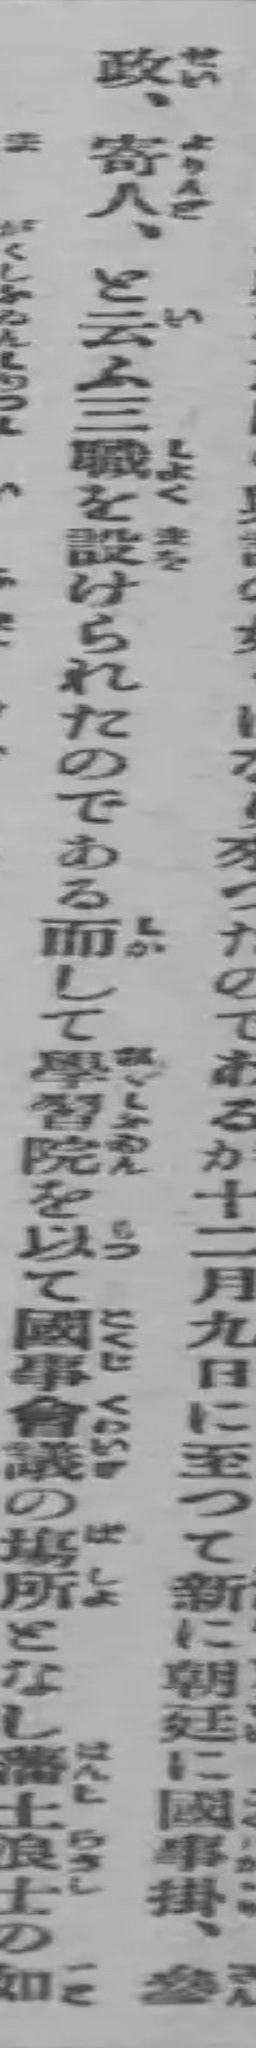政、寄人といふ三職を設けられたのである而して学習院を以て国事会議の場所となし藩士浪士の如
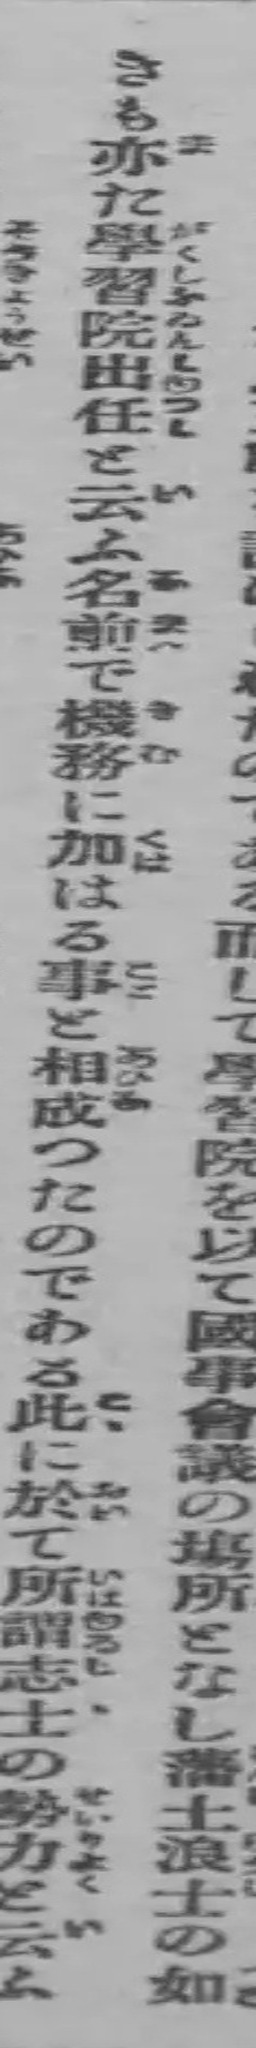きも亦た学習院出仕と云ふ名前で機務に加はる事と相成つたのである此に於て所謂志士の勢力と云ふ
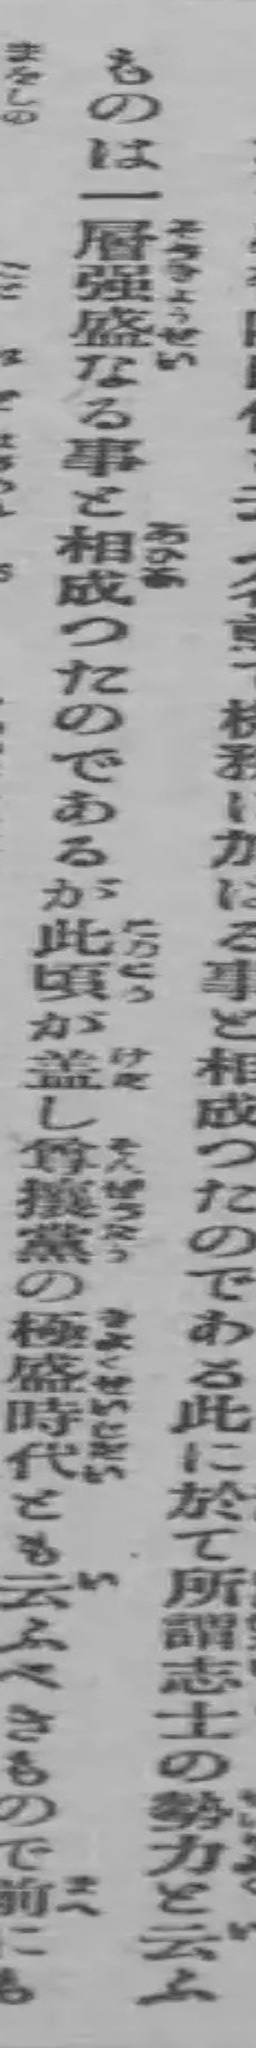浪士の暴行ものは一層強盛なる事と相成つたのであるが此頃が蓋し尊攘党の極盛時代とも云ふべきもので前にも
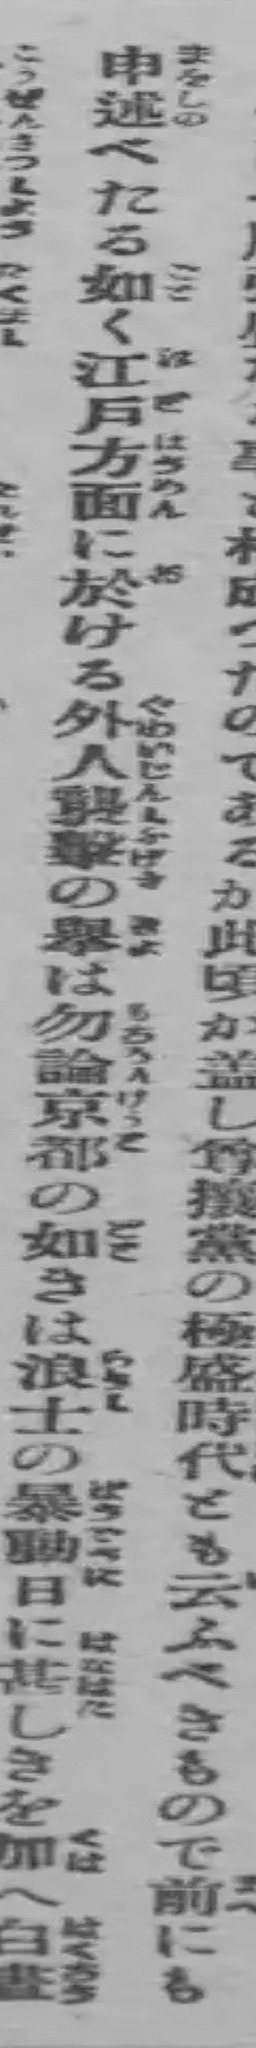申述べたる如く江戸方面に於ける外人襲撃の挙は勿論京都の如きは浪士の暴動日に甚しきを加へ白昼
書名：豊橋市史談
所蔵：国立国会図書館 National Diet Library, JAPAN
